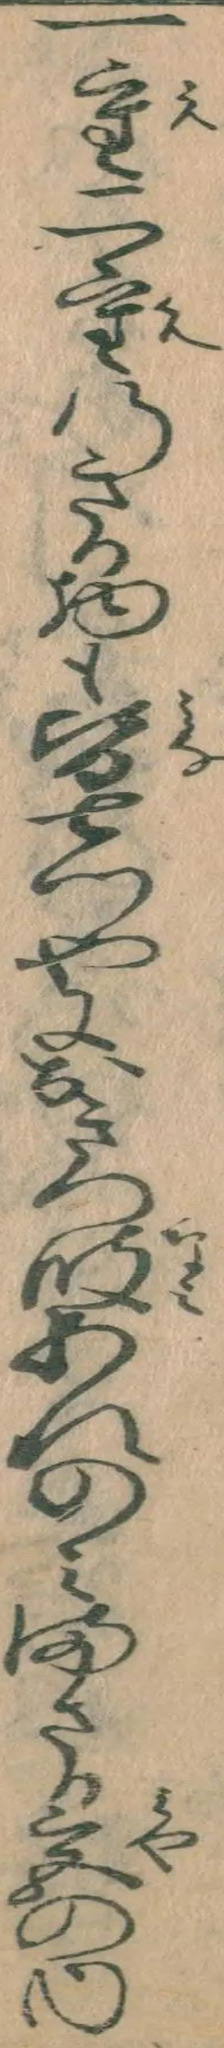一重二重のきる物も皆七つやにおきつ波あれのみまさる宮の内
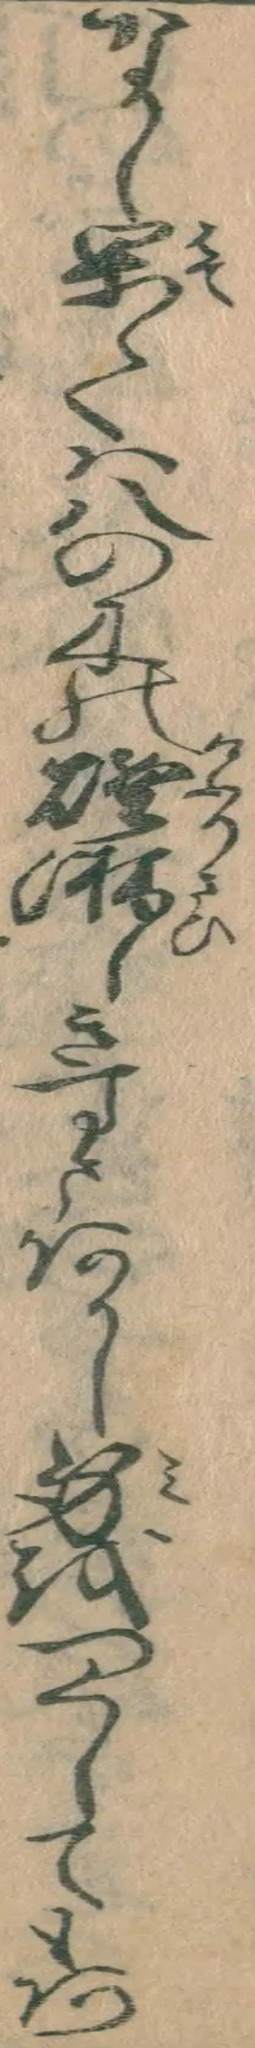なかし果ては八の木の煙淋しきすまあかし身をつくしてもあ
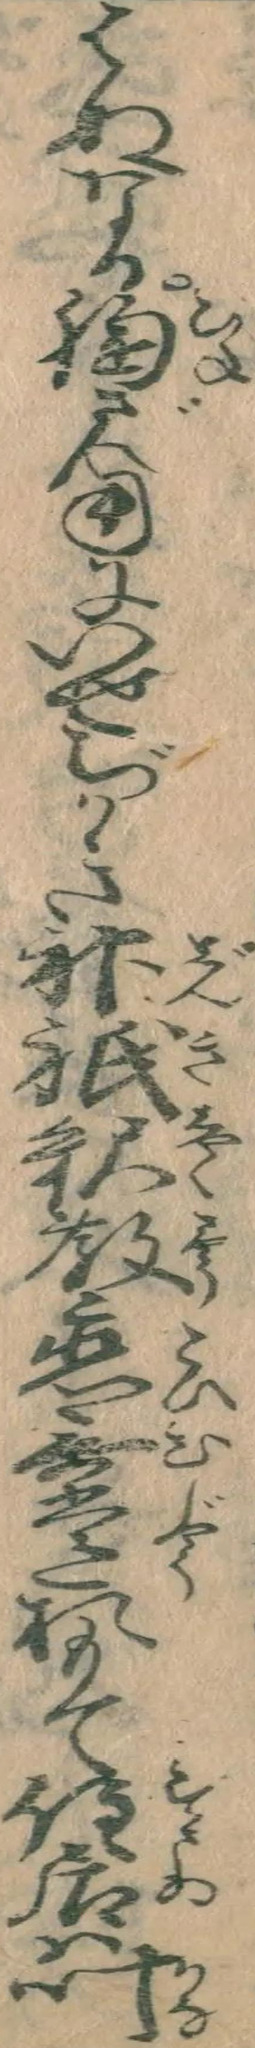はぬなり。胸ざん用にいせぢかき神祇釈教恋無常おもて住居は叶
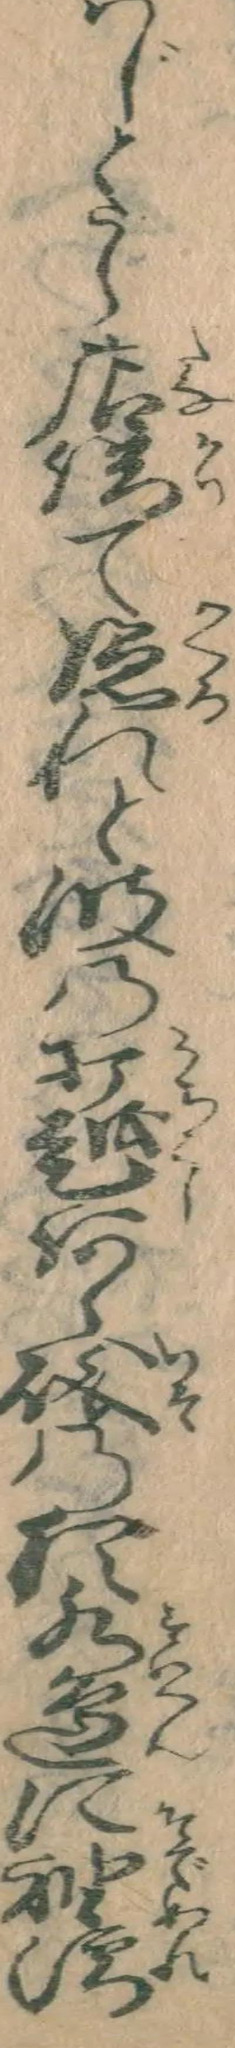はじとうら店借て隠れと波の打越あら磯の猶水辺に袖濡て
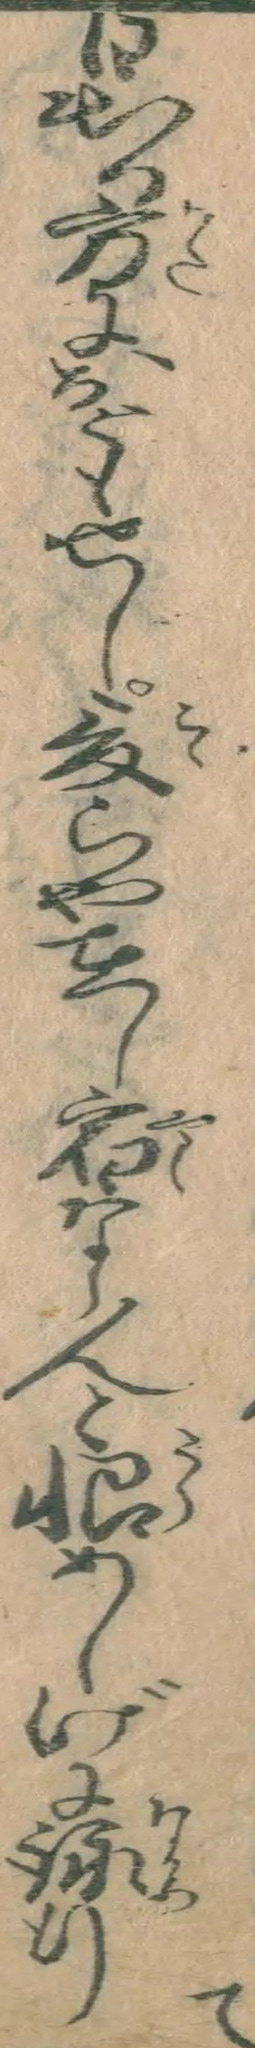日出る方におともせじ。爰らや在し宿ならんと恨めしげに詠行
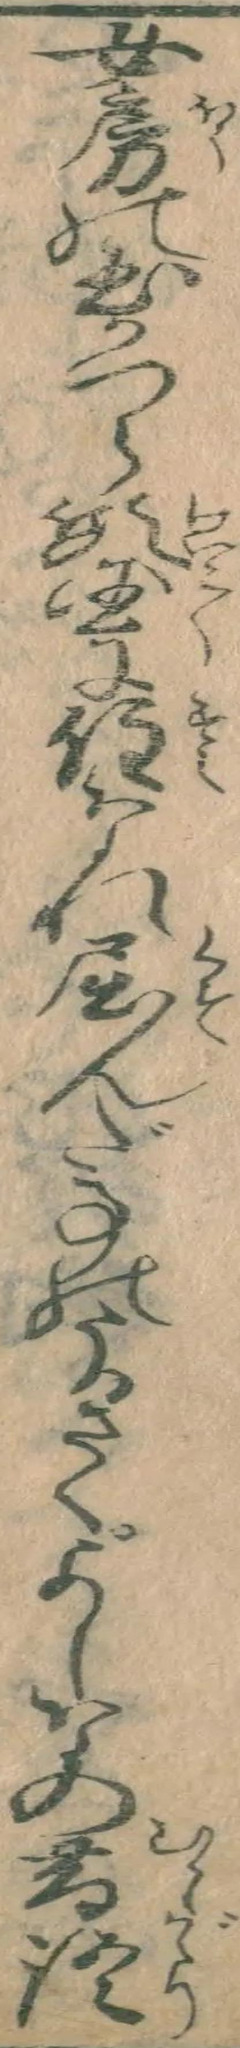女房の出かつら傾国に住なれ屈んだ事のうるさく。よしなの昔語
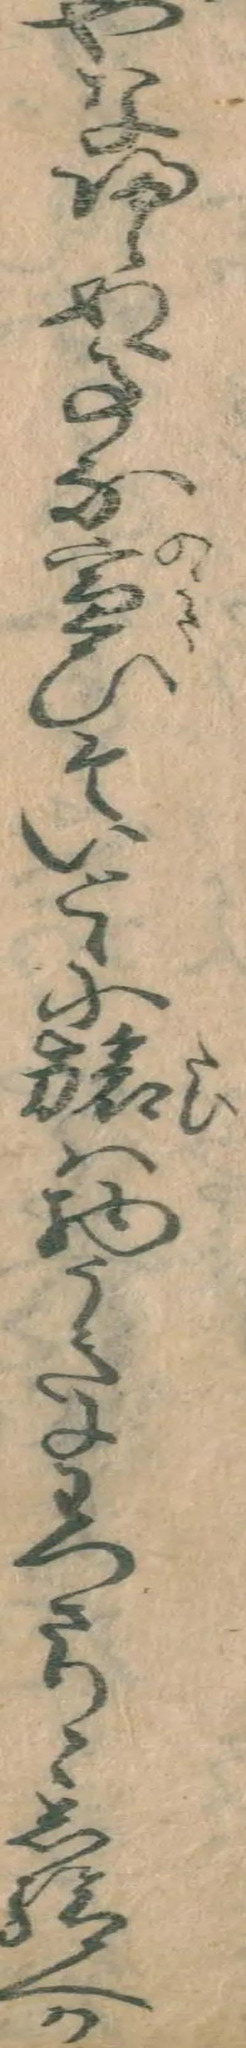やな帰らぬ事な宣ひそいとゝに旅は物うきにわつさりとし給へか
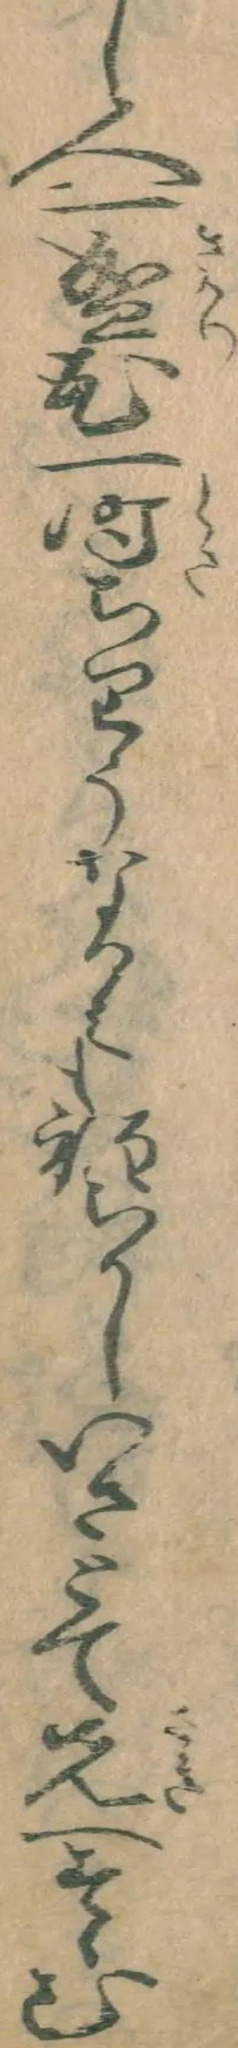し人一盛花一時ちりうなるみも程ちかしいさとて先へすゝむ

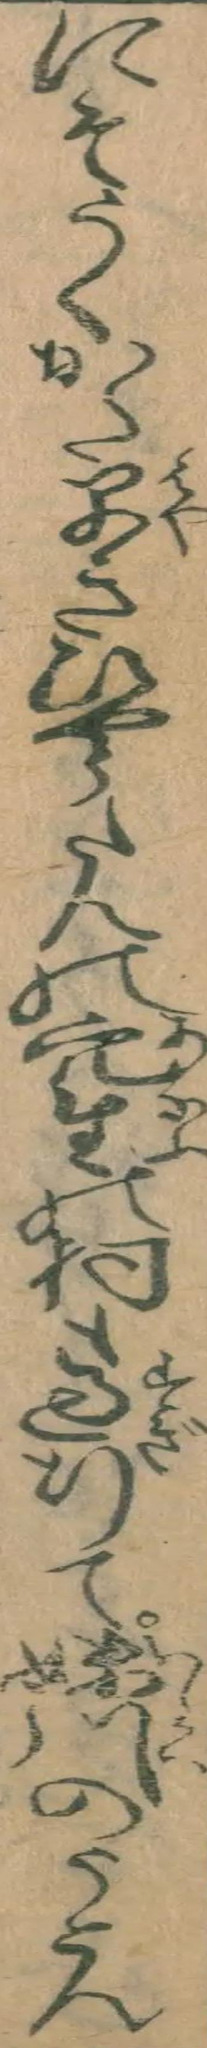にそうくかた早きひやうたんの穴生の村も過行て。妹川のうとん
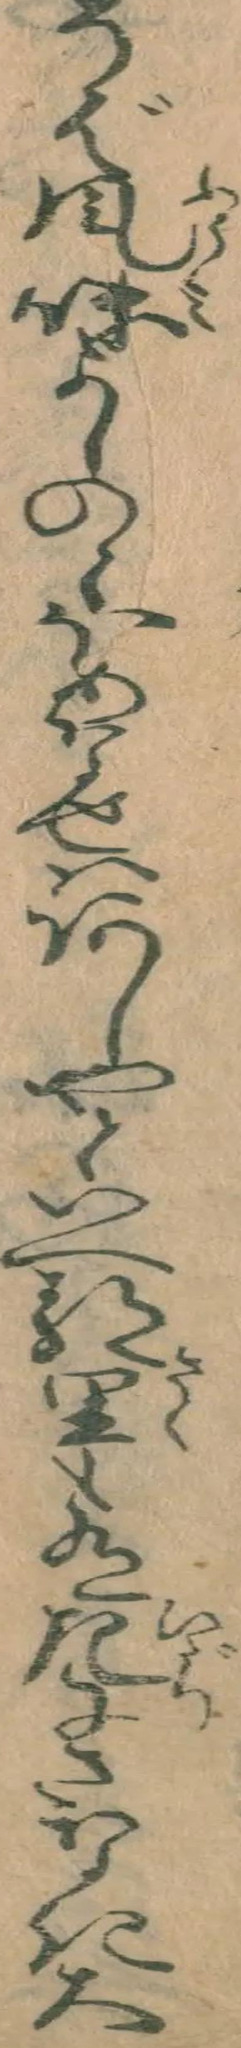そば風味よしのとほめなせはあしやといへる里も有左にさなき大
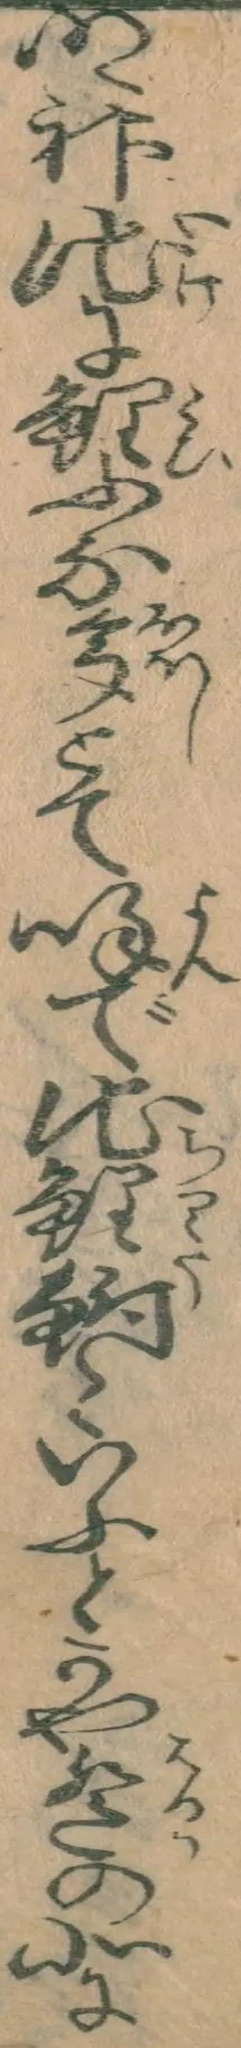明神池に鯉ふな多とて呼で池鯉鮒といふとかや遥の北に
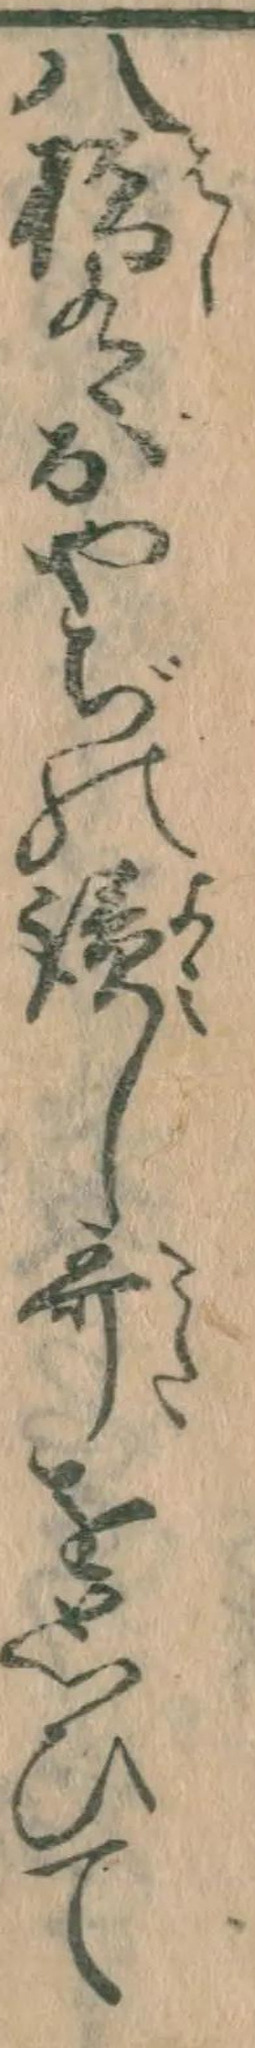八橋有おやぢの読し歌を思ひて
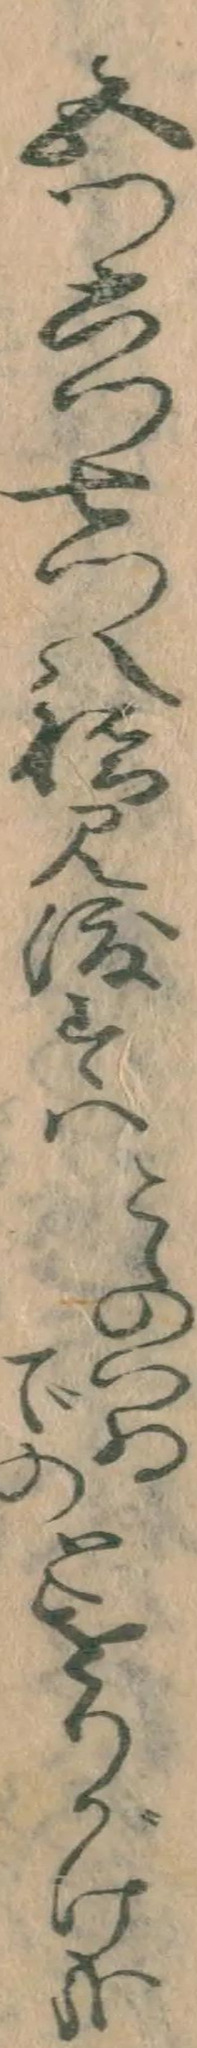五つ六つ七つ八橋見渡すはこゝのつゐでのとをりがけ哉
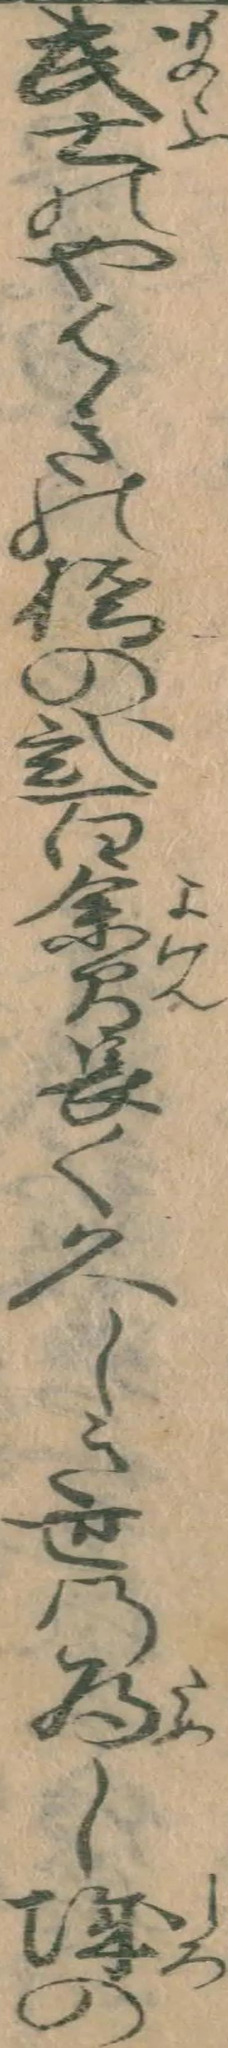武士のやはきの橋の弐百余間長く久しき世の為し城の
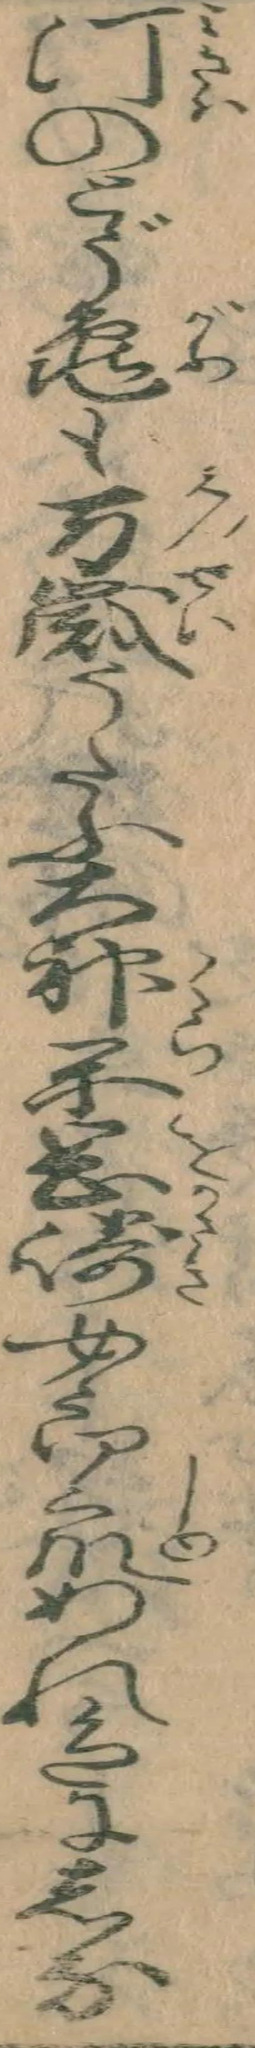汀のどろ亀も万歳うたふ大神楽岡崎女郎衆ぬれ色にしな
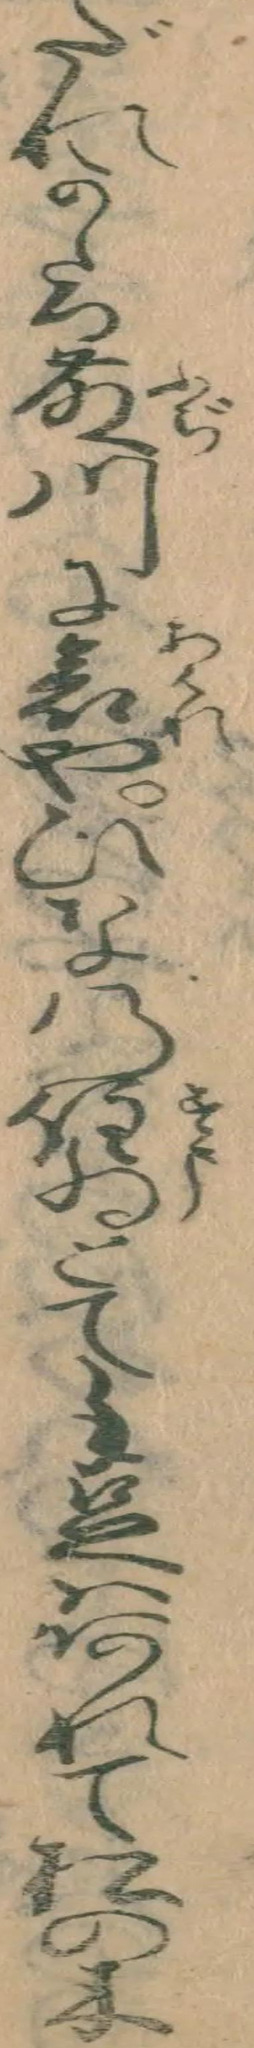だれかゝる藤川に哀や。ひなの住ゐとて手足はあれて松の木
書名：新竹斎 5巻
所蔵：国立国会図書館 National Diet Library, JAPAN
